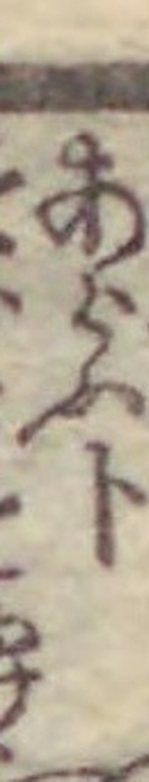あらふと
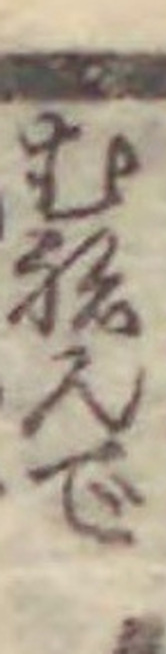むねんで
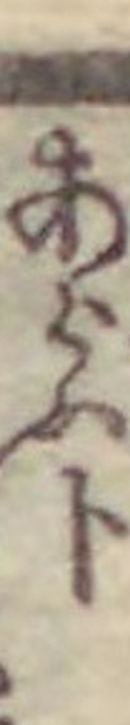あらふと
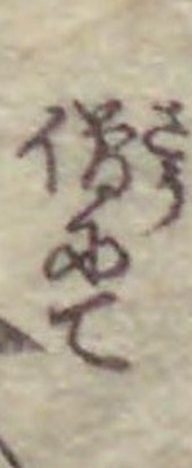僧にて
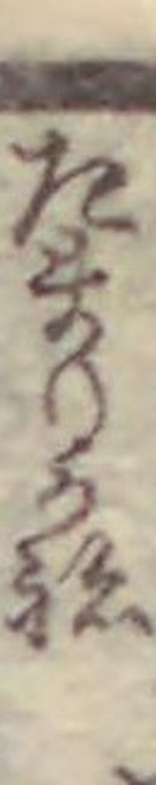たまりかね
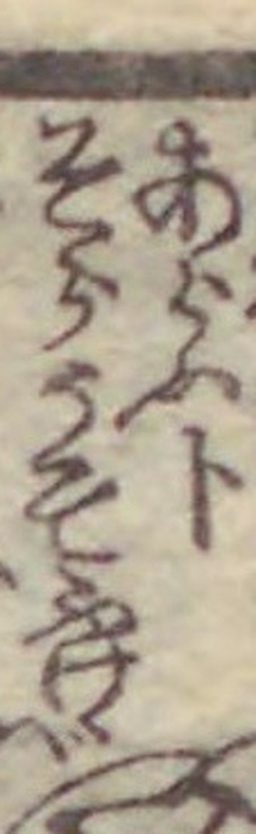そゝりうそふけば
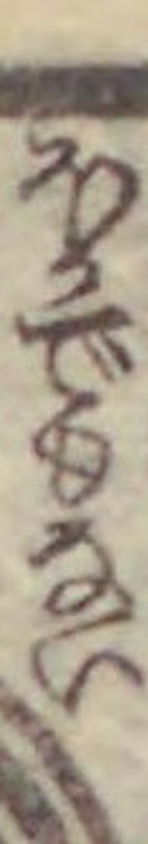ほかでもない
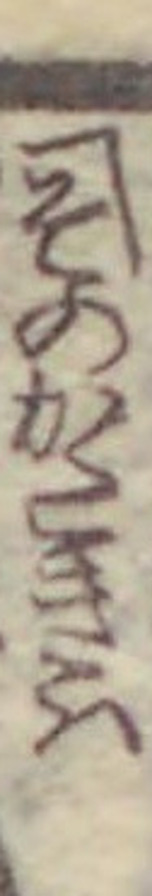〽そのかたきは
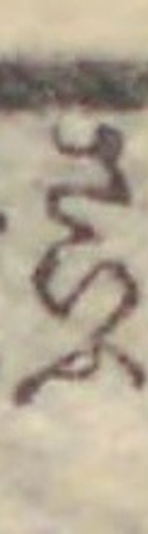さいふ
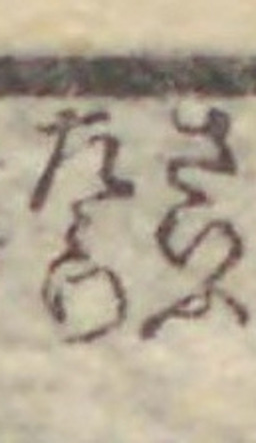左衛門
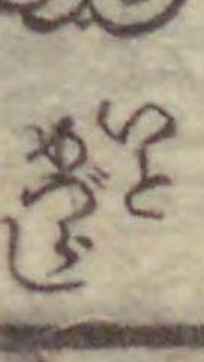めづらし
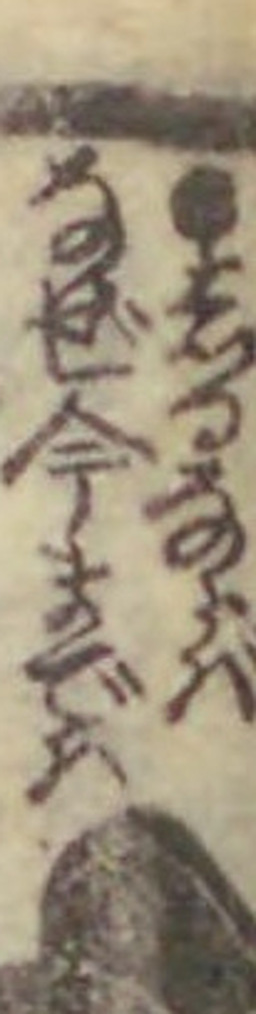なぜ今までは
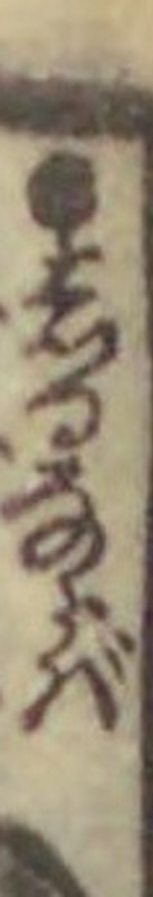●しるならば
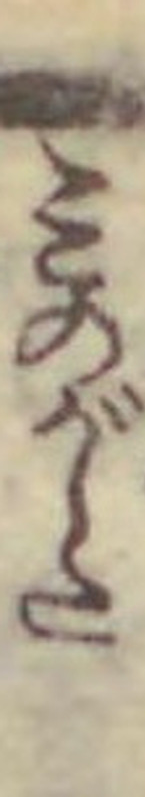みのがした
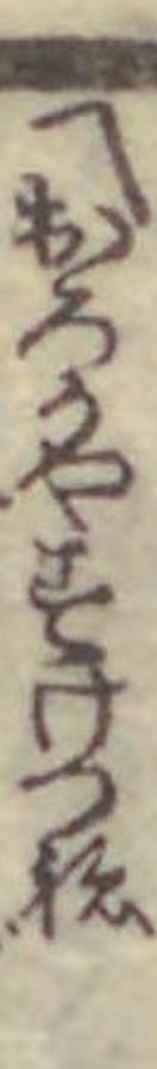〽おろかやすけつね
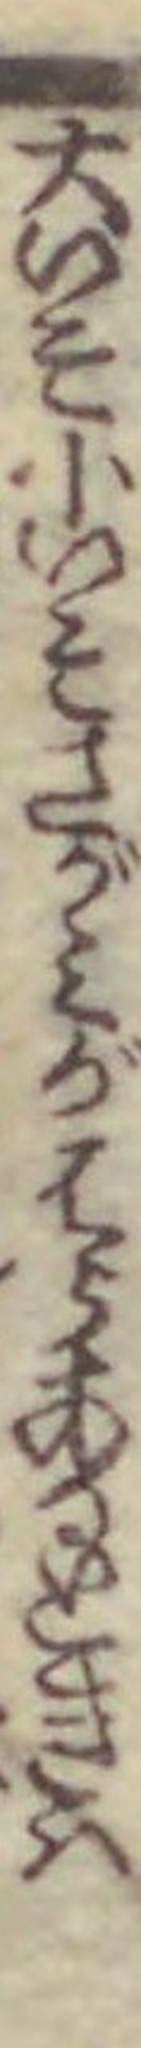大いそ小いそさがみがはらのあるときは
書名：大時代唐土化物 3巻. 曽我太夫染
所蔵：国立国会図書館 National Diet Library, JAPAN
